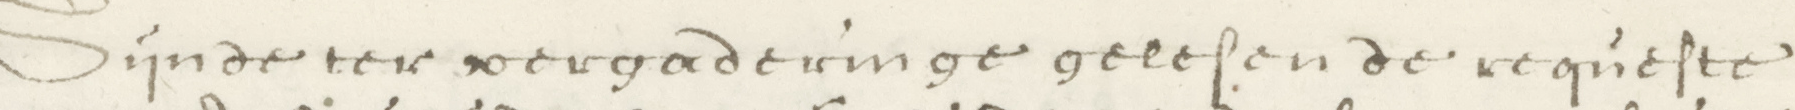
Sijnde ter vergaderinge gelesen de requeste
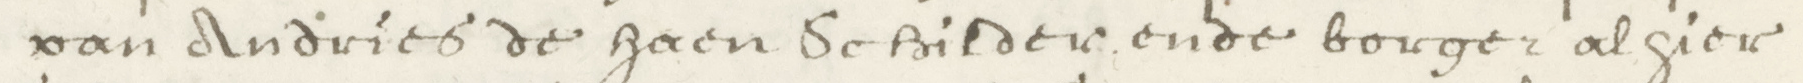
van Andries de haen Schilder ende borger alhier
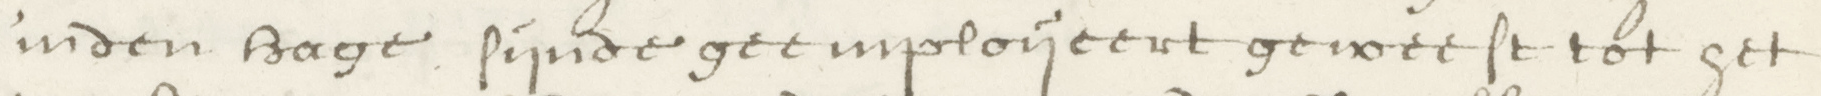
inden hage, sijnde geemploijeert geweest tot het
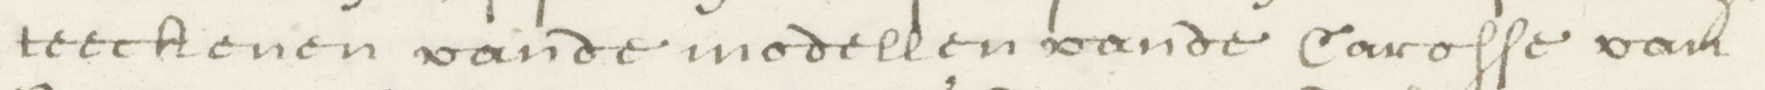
teeckenen vande modellen vande Carosse van
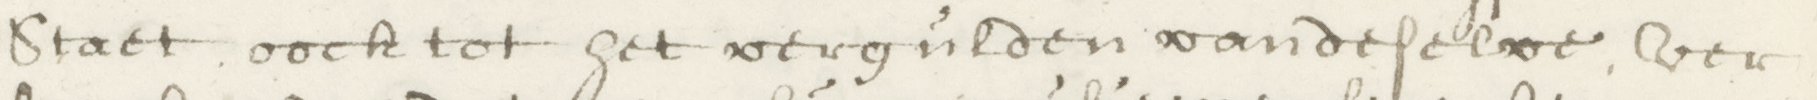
Staet, oock tot het vergulden van deselve, ver
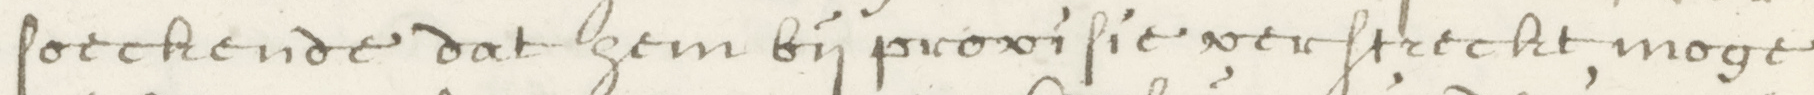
soeckende dat hem bij provisie verstreckt moge
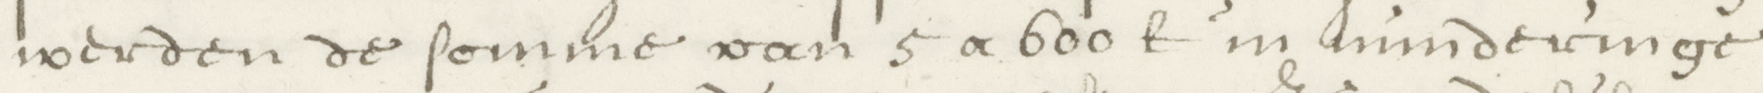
werden de somme van 5 a 600 L in minderinge
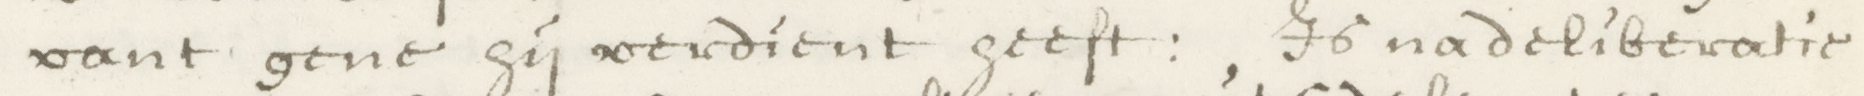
vant gene hij verdient heeft: Is na deliberatie
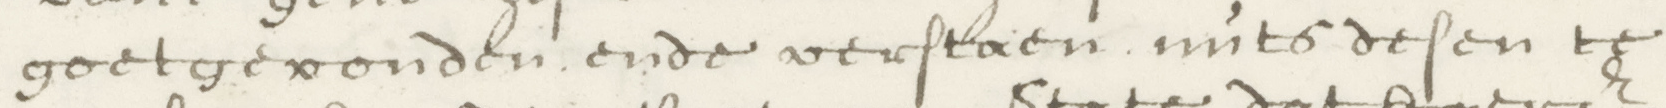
goetgevonden, ende verstaen, mits desen te
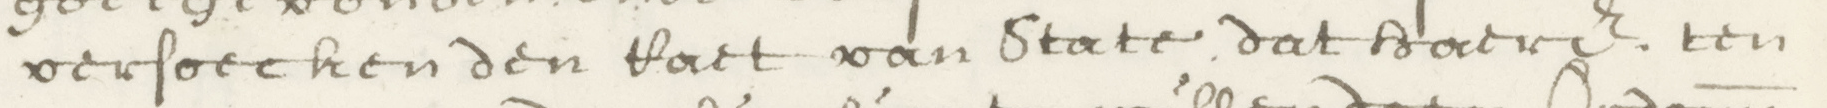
versoecken den Raet van State dat haer E. ten
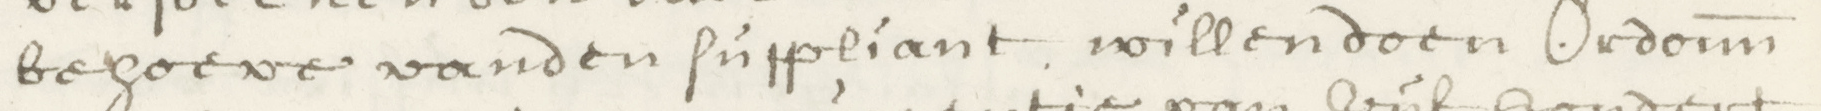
behoeve vanden suppliant, willen doen Ordonn
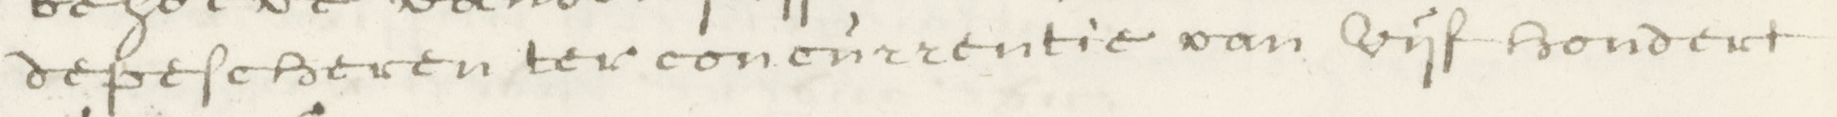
depescheren ter concurrentie van vijf hondert
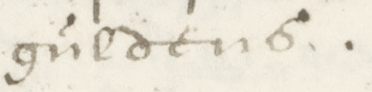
guldens.
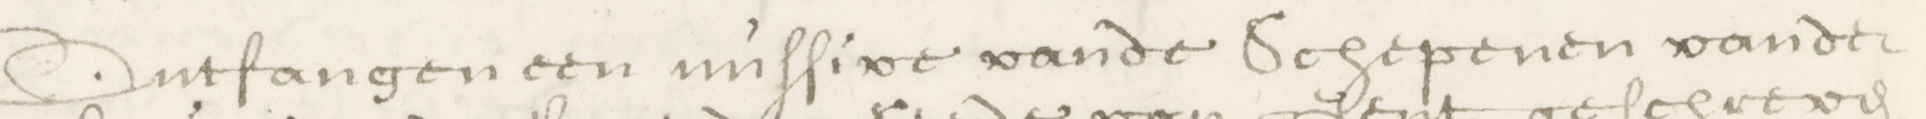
Ontfangen een missive vande Schepenen vander
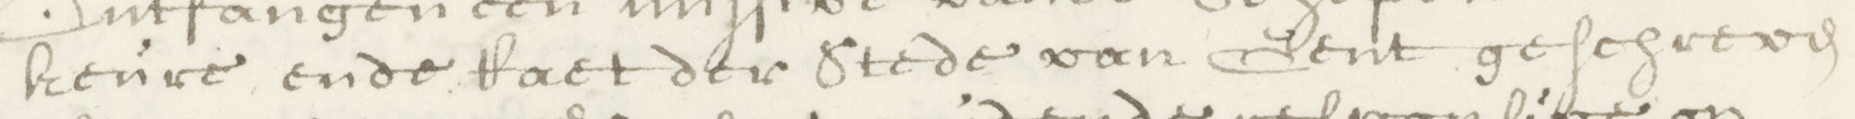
keure, ende Raet der Stede van Gent geschreven
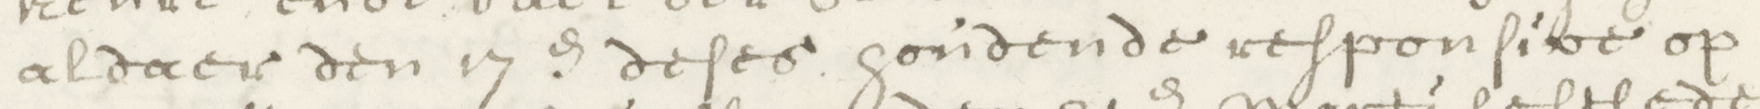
aldaer den 17en. deses, houdende responsive op
